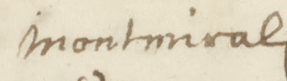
Montmiral
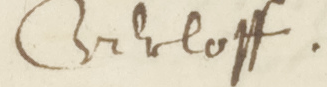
Verloff.
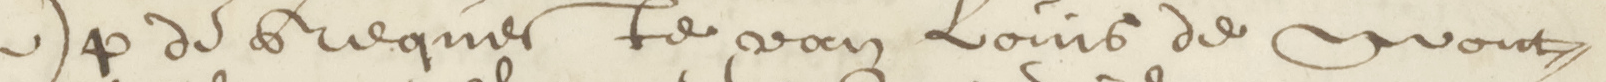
Op de Requeste van Louis de Mont„
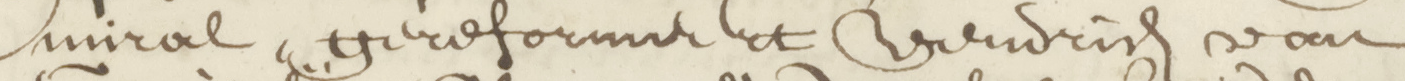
miral, gereformeert Vendrich van
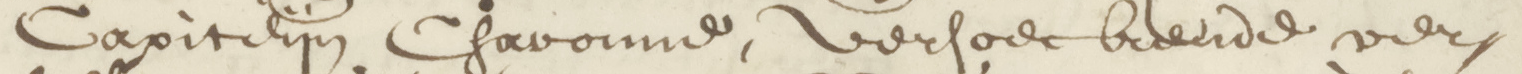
Capiteijn Charonne, Versoeckende ver„
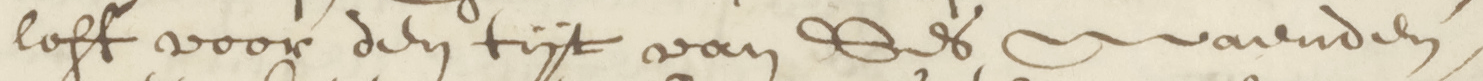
loff voor den tijt van Ses Maenden,
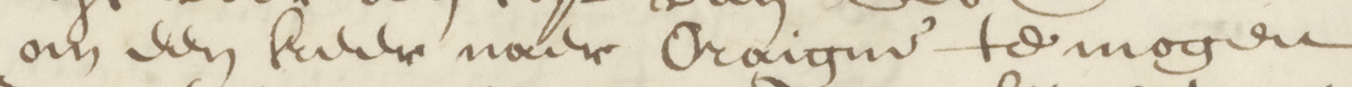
om een keer naer Oraigne te mogen
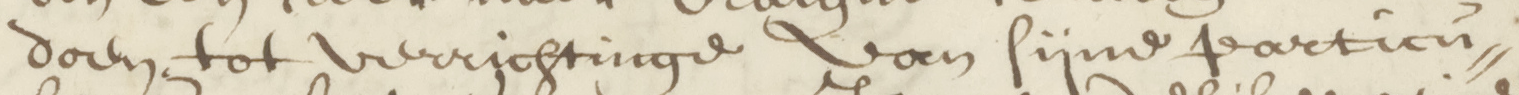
doen tot verrichtinge van sijne particu„
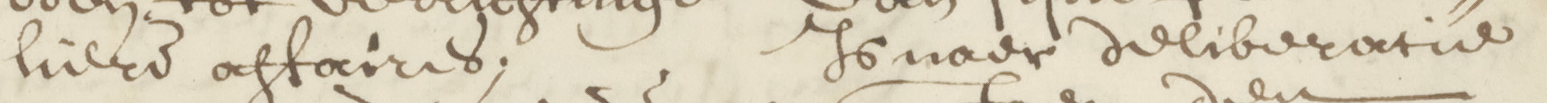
liere affaires. Is naer deliberatie
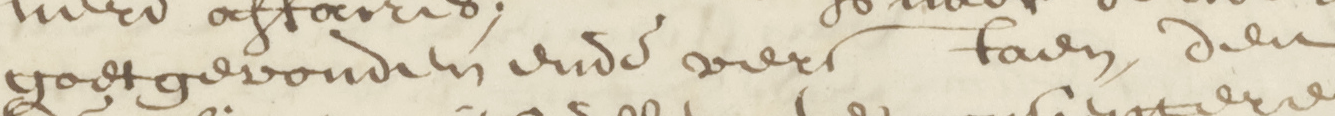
goetgevonden ende verstaen, den
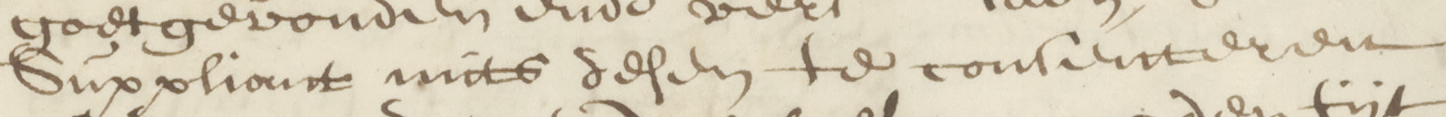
Suppliant mits desen te consenteren.
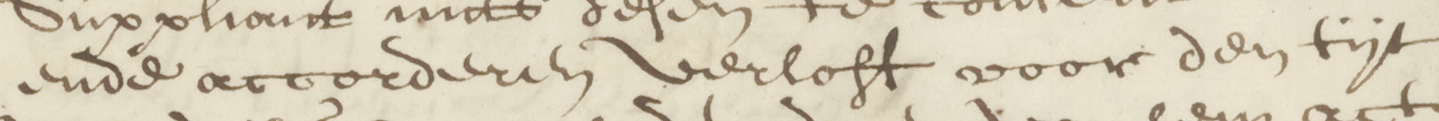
ende accorderen verloff voor den tijt
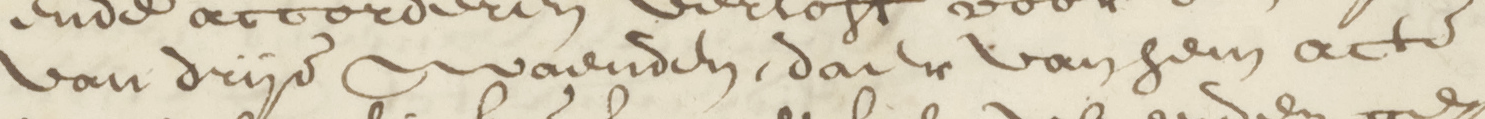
van drije Maenden, daer van hem acte
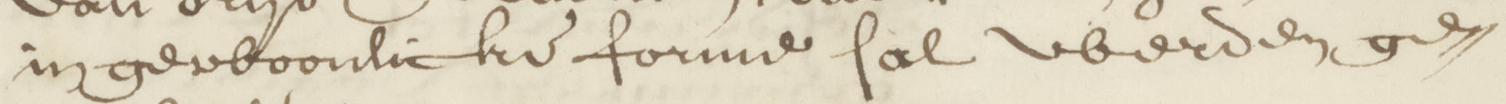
in gewoonlicke forme sal werden ge„
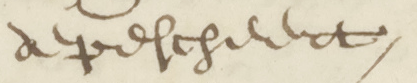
depescheert.
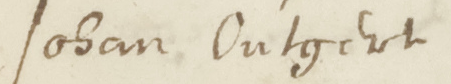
Johan Outgert
